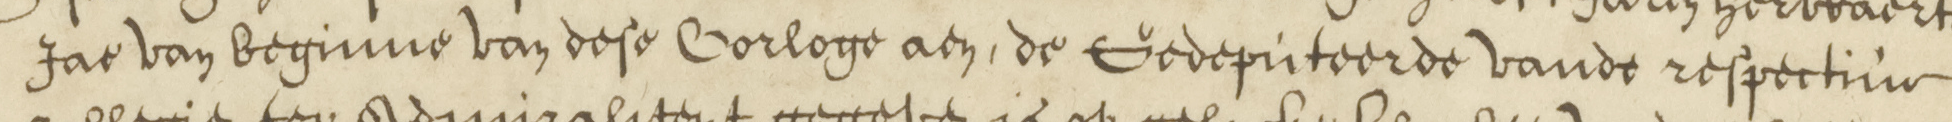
jae van beginne van dese Oorloge aen, de Gedeputeerde vande respectiue
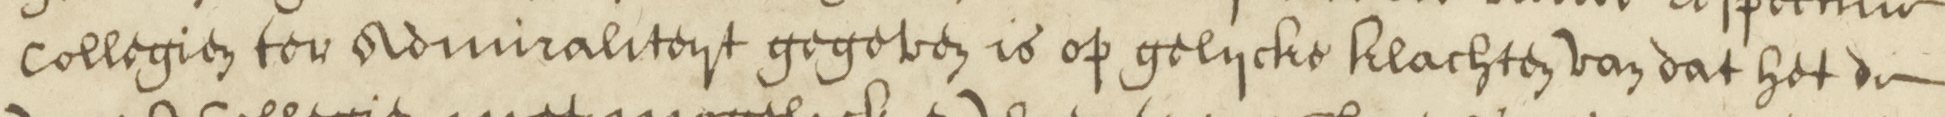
Collegien ter Admiraliteyt gegeven is op gelycke klachten van dat het de
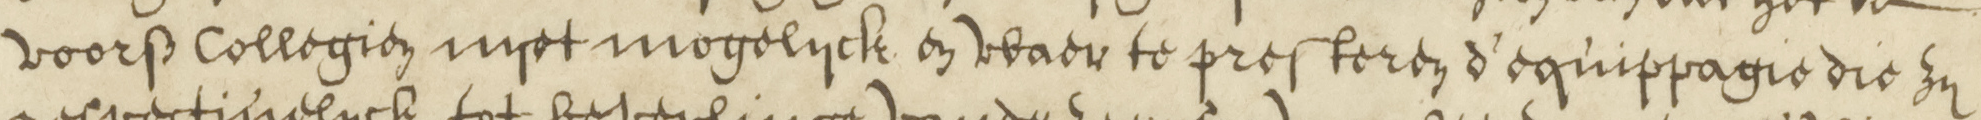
voors Collegien nyet mogelyck en waer te presteren d'equippagie die zy
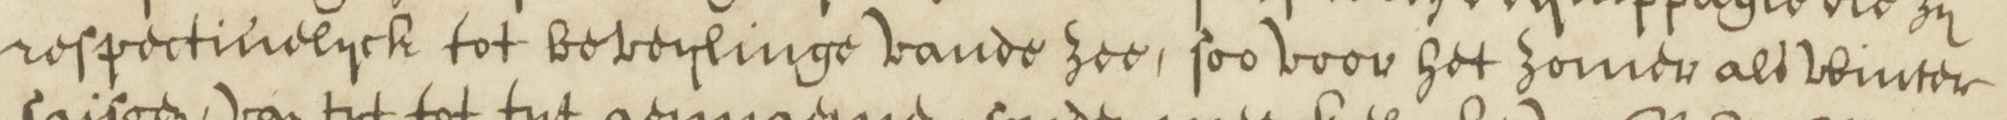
respectivelyck tot beveylinge vande zee, soo voor het zomer als winter
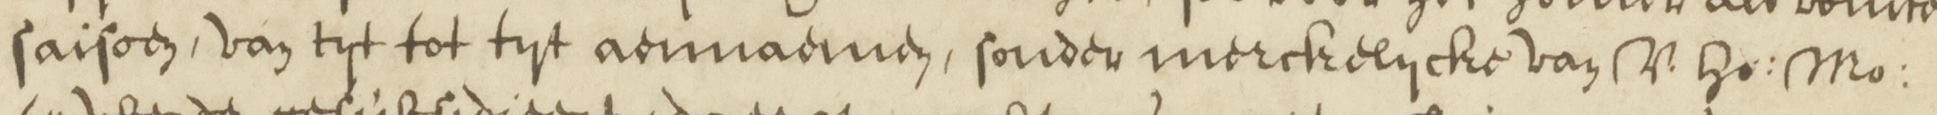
saison, van tyt tot tyt aennaemen, sonder merckelycke van U. Ho:Mo:
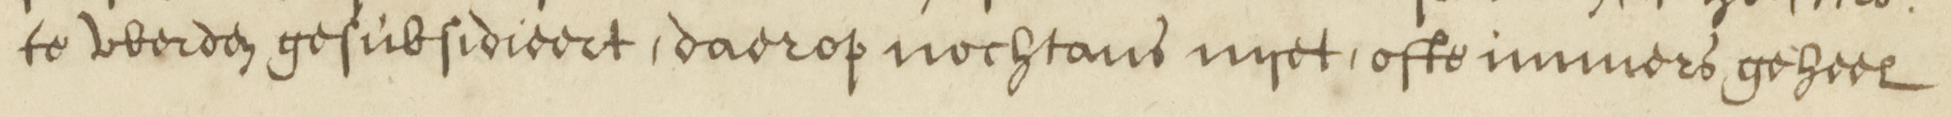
te worden gesubsidieert, daerop nochtans nyet, ofte immers geheel
